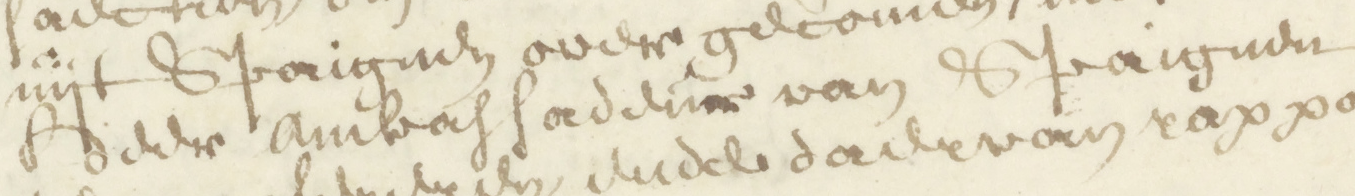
Heer Ambassadeur van Spaignen
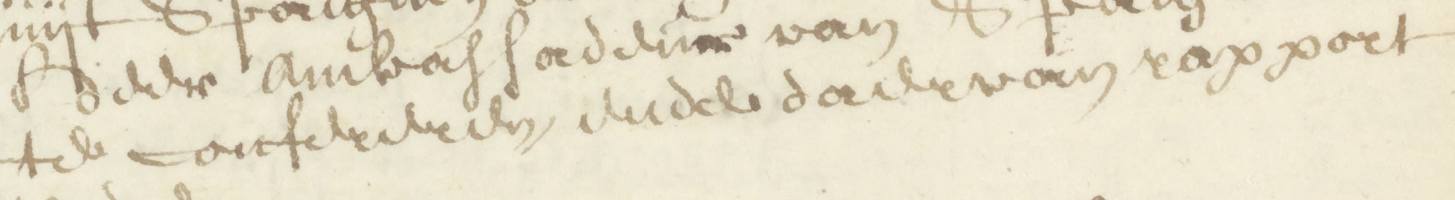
te confereren, ende daervan rapport
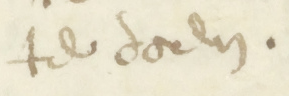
te doen.
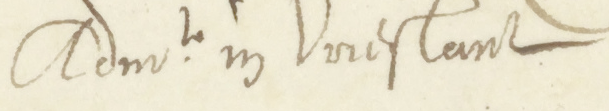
Admt. in Vrieslant
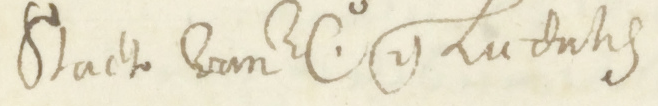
Staet van C. & Licenten
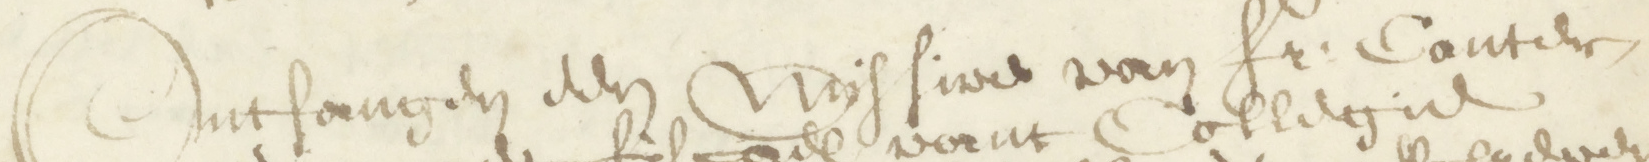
Ontfangen een Missive van Fr. Canter,
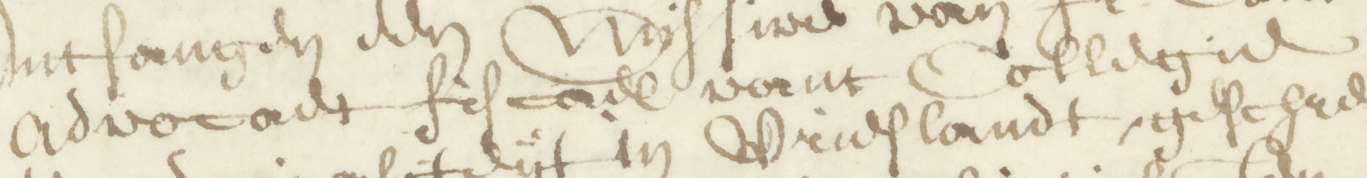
Advocaet fiscael vant Collegie
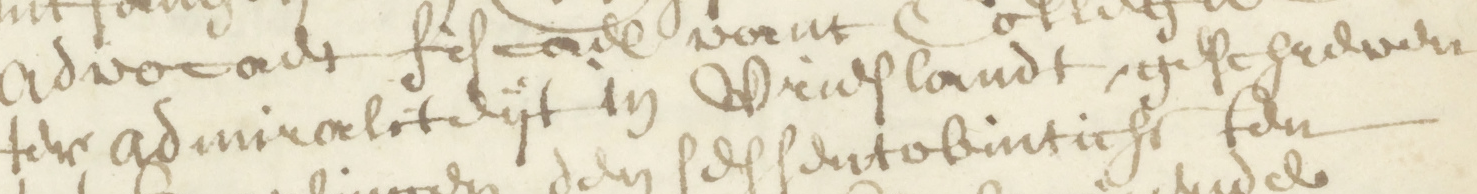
ter Admiraliteijt in Vrieslandt, geschreven
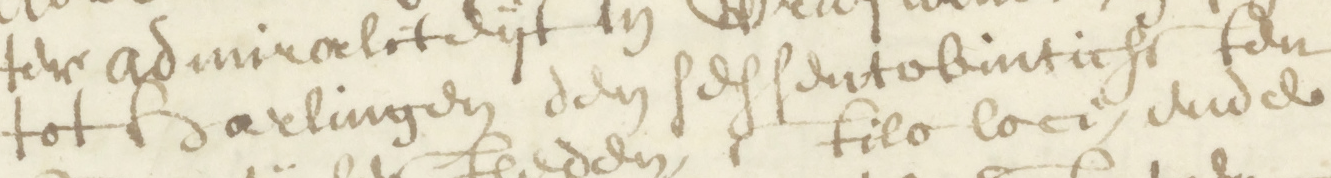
tot Harlingen den sessentwintichsten
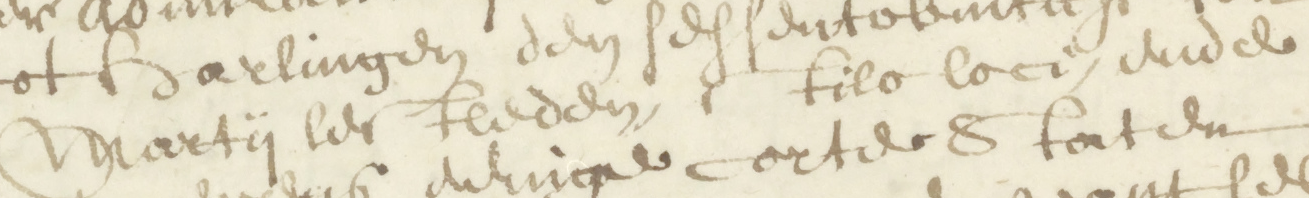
Martij lestleden, stilo loci, ende
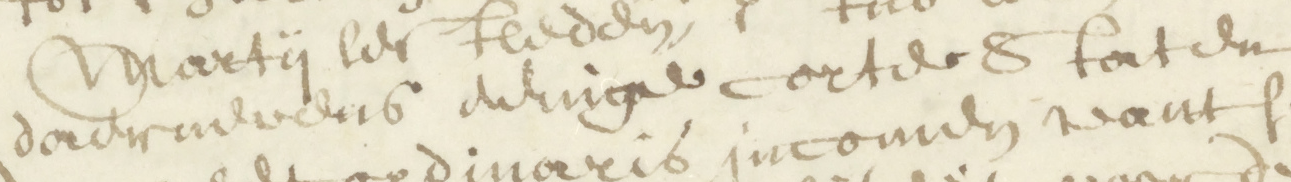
daernevens eenige corte Staten
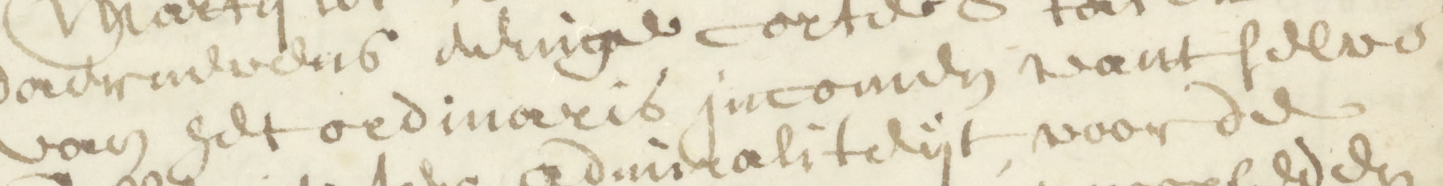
van het ordinaris incomen vant selve
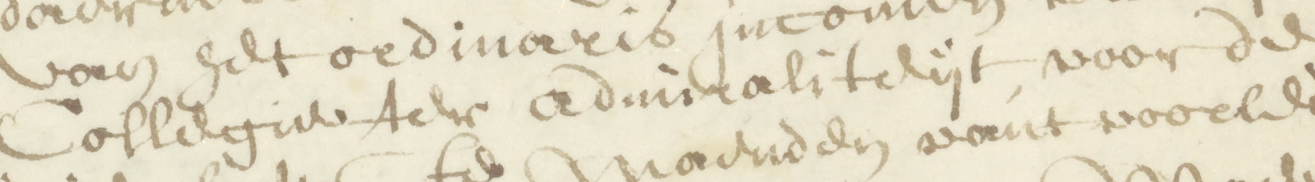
Collegie ter Admiraliteijt voor de
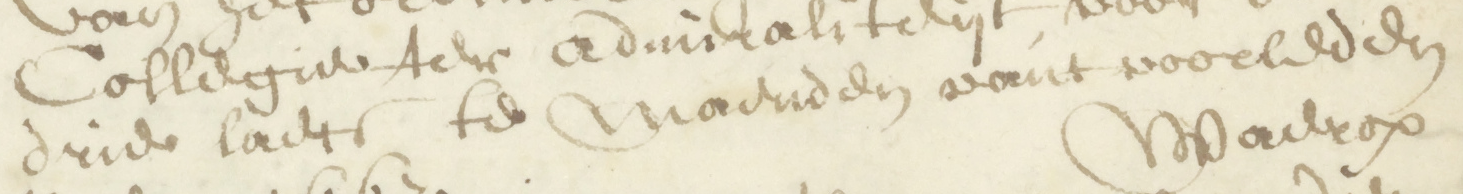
drie laetste maenden vant voorleden
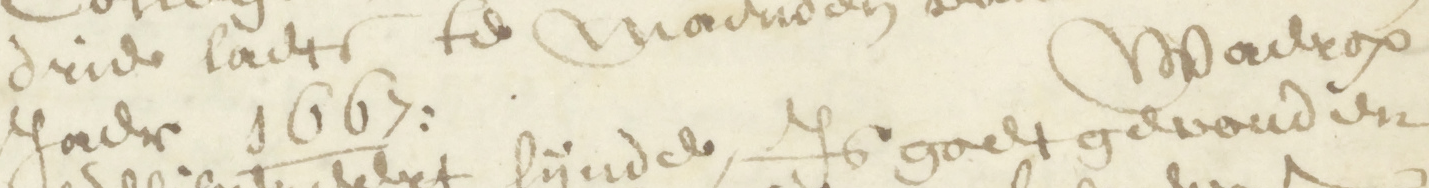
Jaer 1667: Waerop
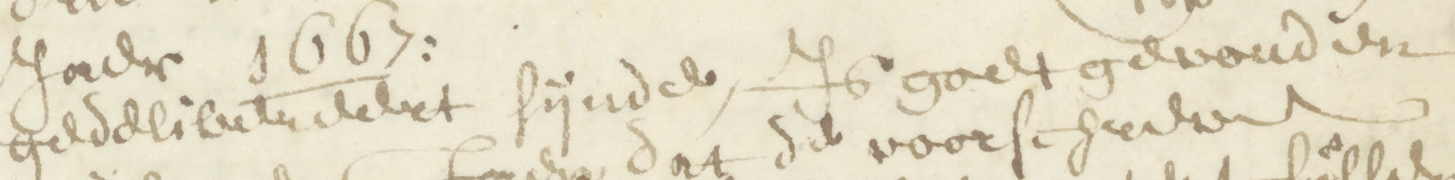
gedelibereert sijnde, Is goetgevonden
